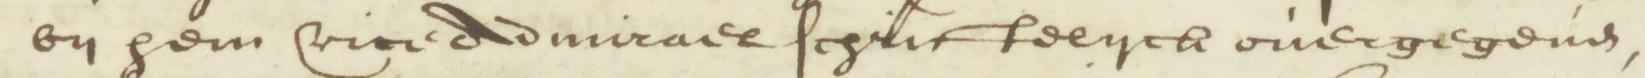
by hem vice Admirael schriftelyck overgegeven,
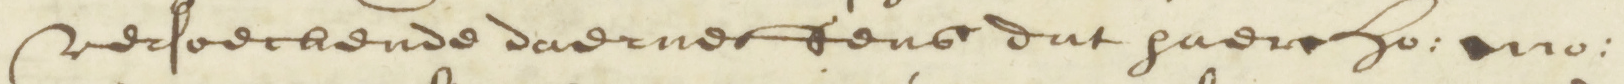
versoeckende daerneffens dat haer Ho:mo:
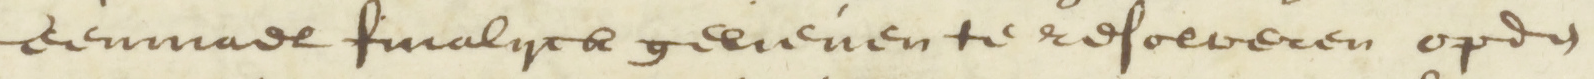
eenmael finalyck gelieven te resolveren opden
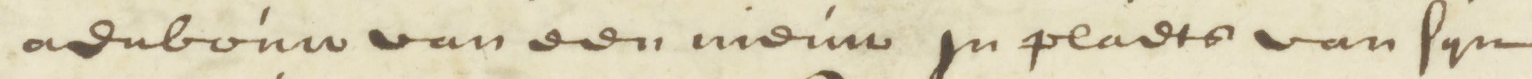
aenbouw van een nieuw in plaets van syn
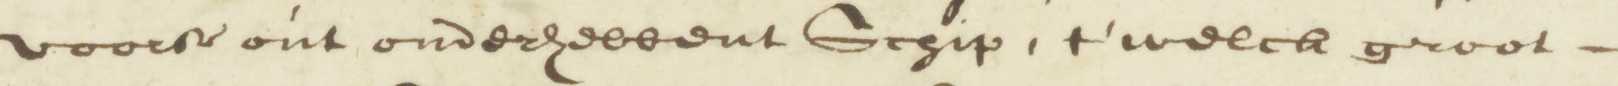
voorsz out onderhebbent Schip, t‛welck groot —
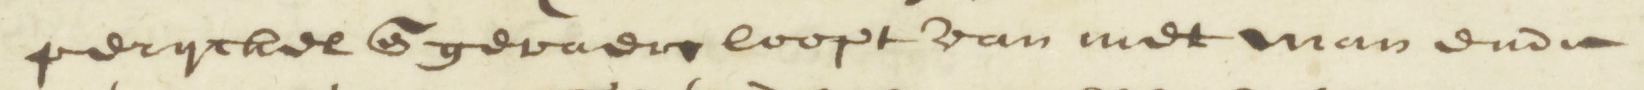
peryckel en gevaer loopt van met man ende
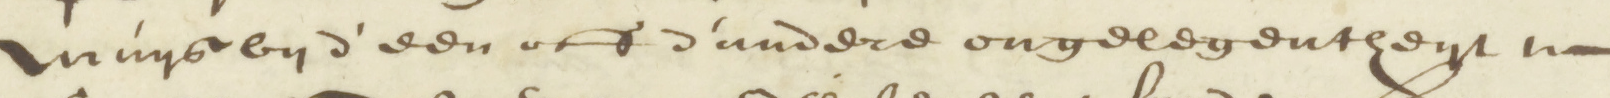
muys by d‛een oft d‛andere ongelegentheyt te
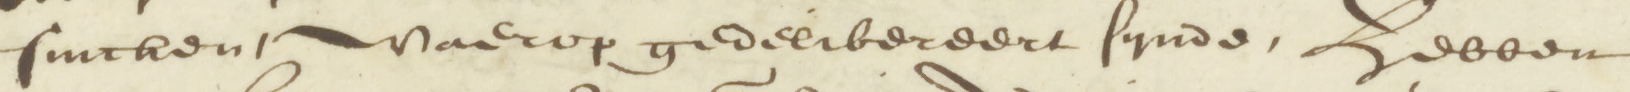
sincken. Waerop gedelibereert synde, hebben
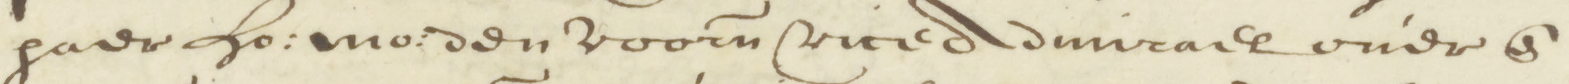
haer Ho:mo: den voorn vice Admirael over en
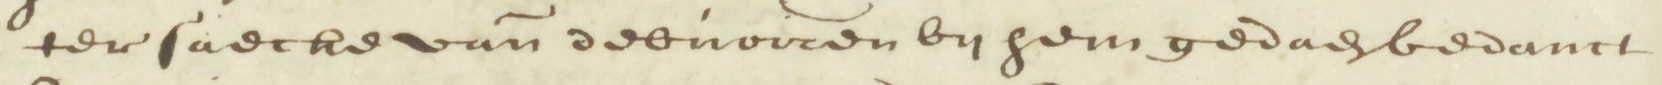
ter saecke van debvoiren by hem gedaen bedanct
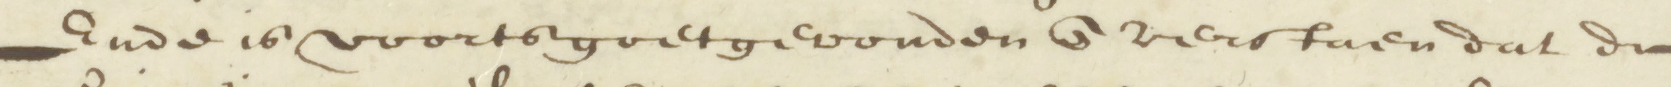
Ende is voorts goetgevonden en verstaen dat de
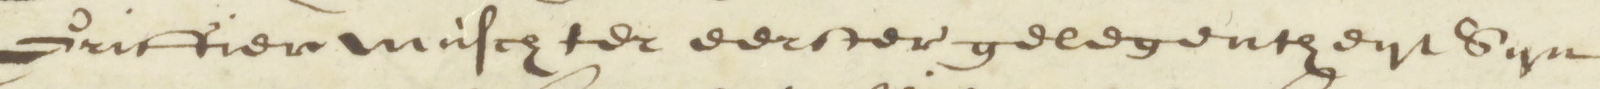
Griffier Musch ter eerster gelegenheyt Syn
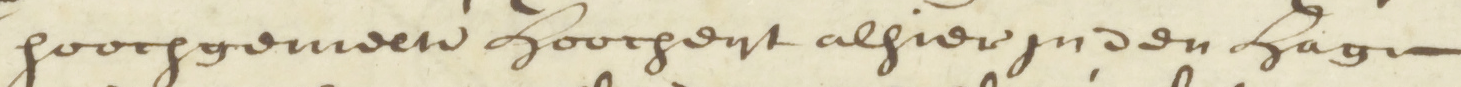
hoochgemelte Hoocheyt alhier in den Hage
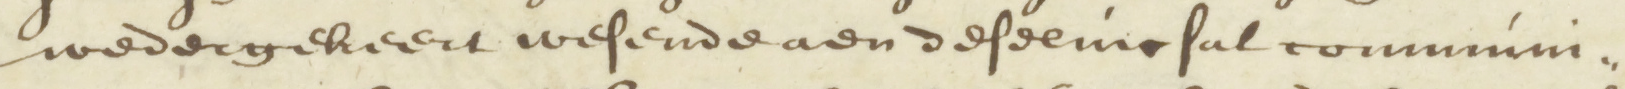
wedergekeert wesende aen deselve sal communi„
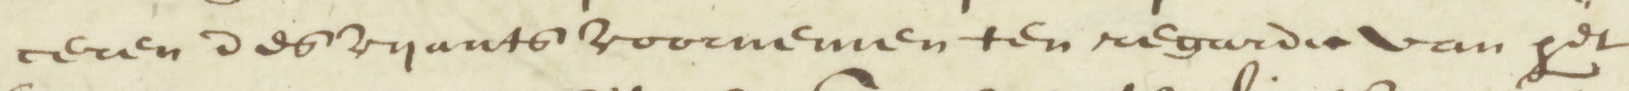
ceren des vyants voornemen ten regarde van het
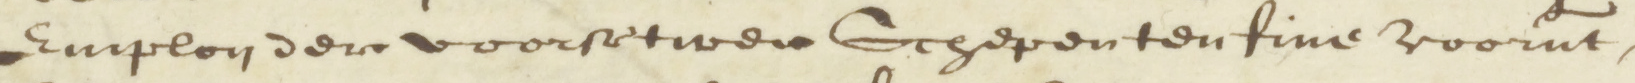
Employ der voorsz twee Schepen ten fine voornt
